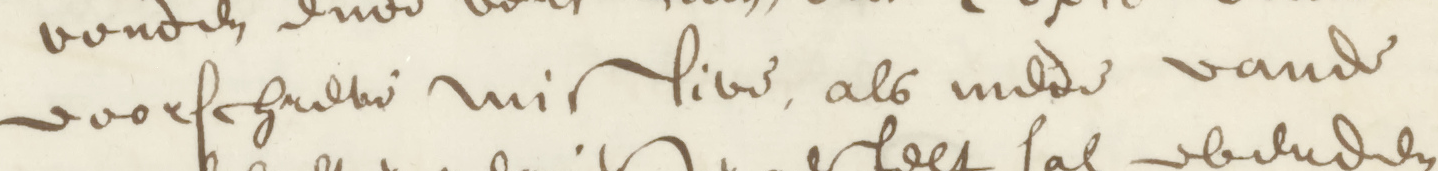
voorschreve missive, als mede vande
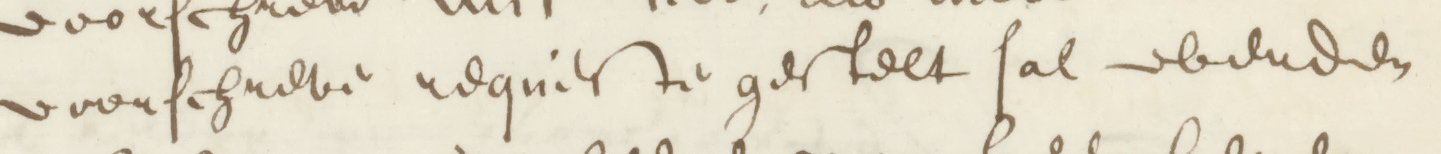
voorschreve requeste gestelt sal werden
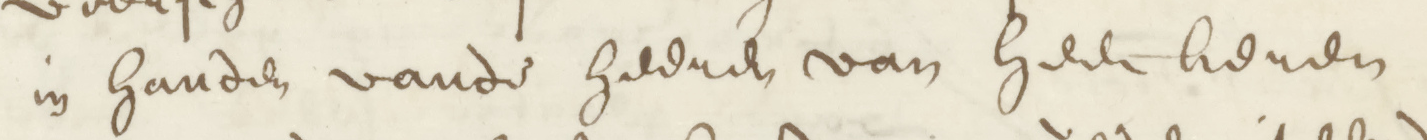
in handen vande heeren van heeckeren
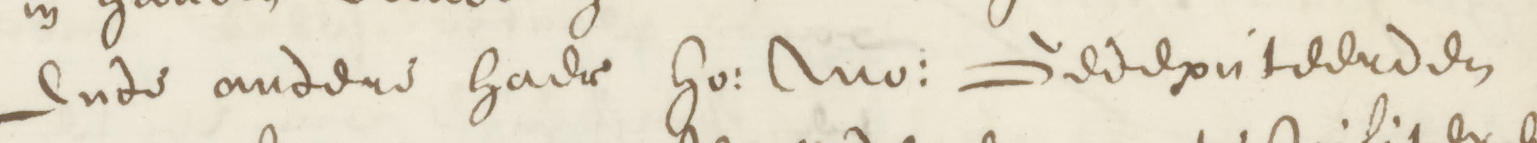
ende andere haer ho:mo: Gedeputeerden
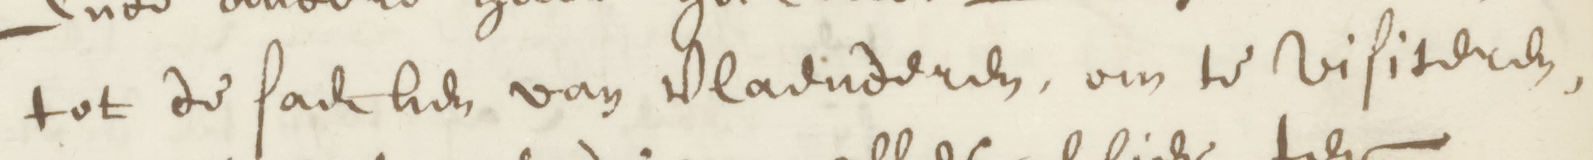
tot de saecken van Vlaenderen, om te visiteren,
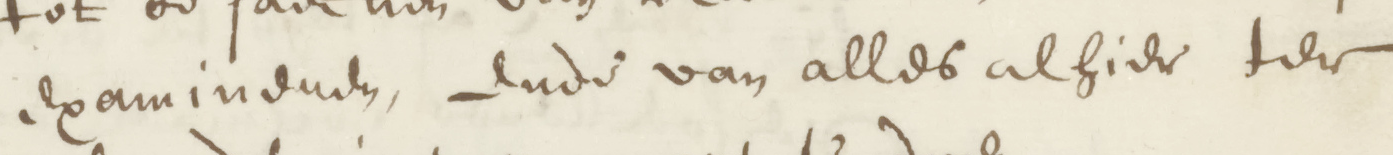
examineren, ende van alles alhier ter
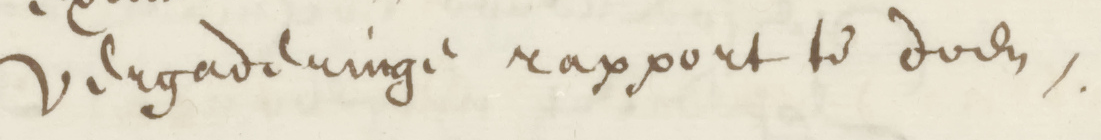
vergaderinge rapport te doen.
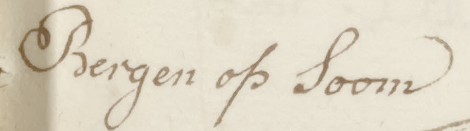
Bergen op Soom
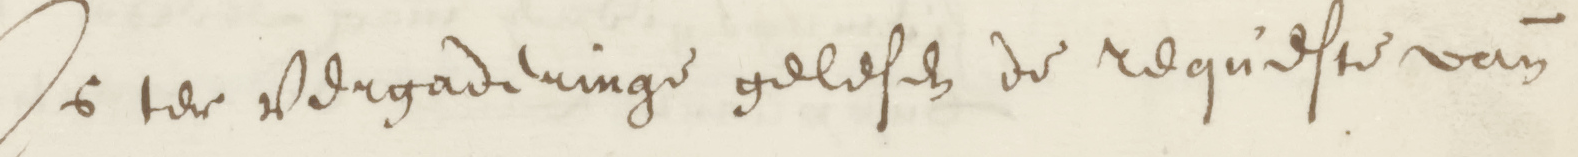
Is ter Vergaderinge gelesen de requeste van
